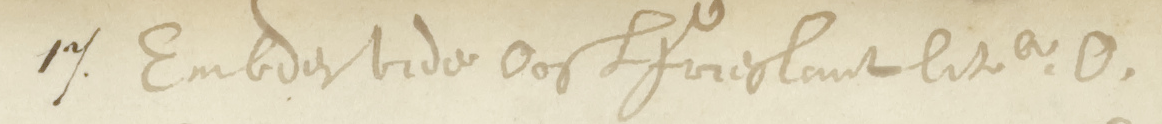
17. Embden vide Oostfrieslant lita.O.
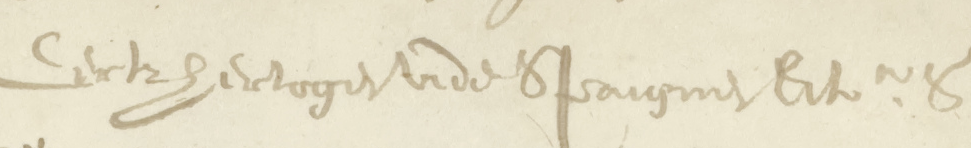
Eertzhertoge vide Spaigne lita.S.
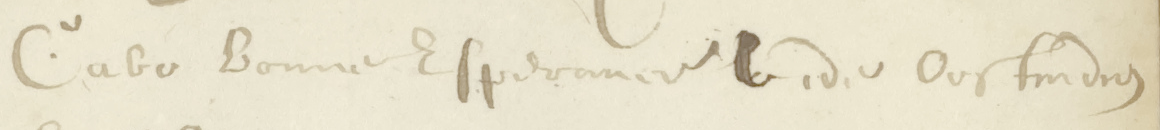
Cabo Bonne Esperance vide Oostindien
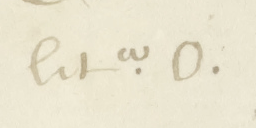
lita.O.
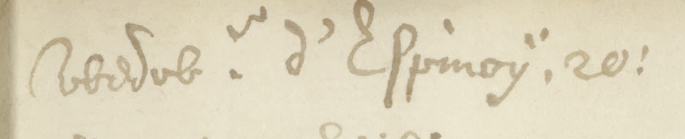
wedue. d‛Espinoy, 20:
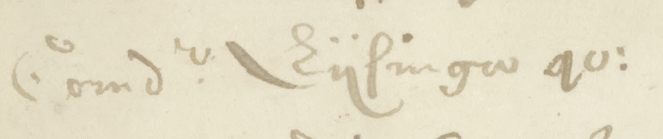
Corndr. Eijsinga 40:
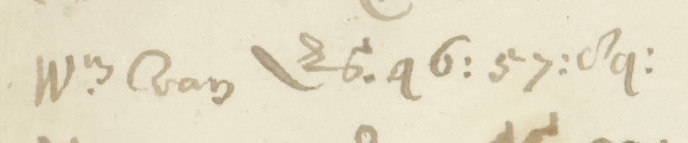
Wm. van Es. 46: 57: 89:
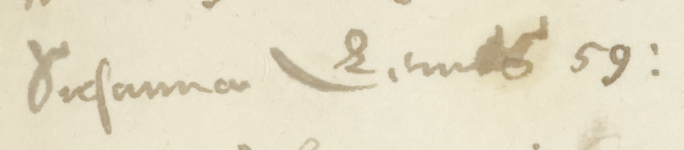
Susanna Eems 59:
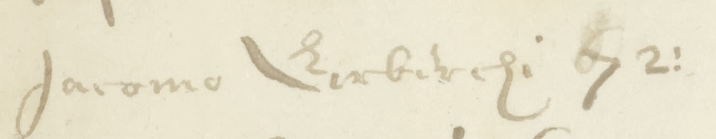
Jacomo Eirberchi 72:
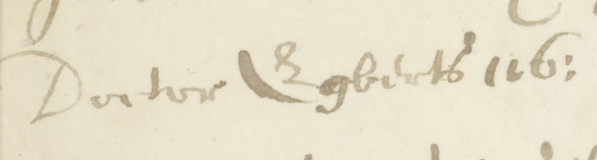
Doctor Egberts 116:
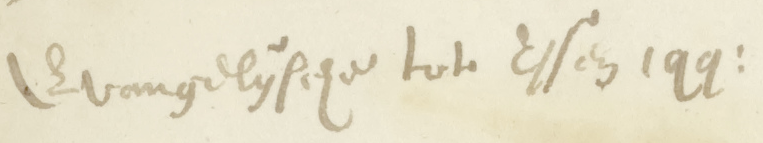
Evangelijsche tot Essen 144:
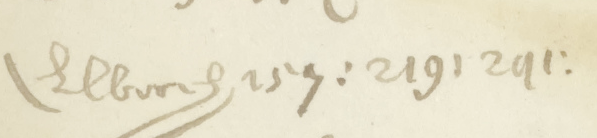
Elburch 157: 219: 291:
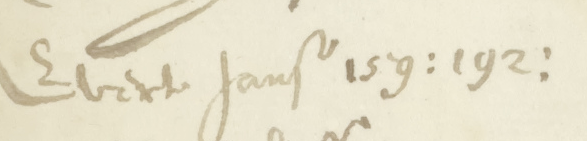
Evert Jans 159: 192:
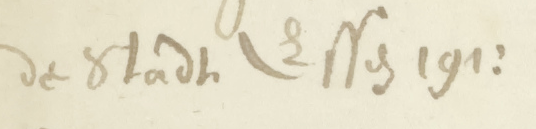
de Stadt Essen 191:
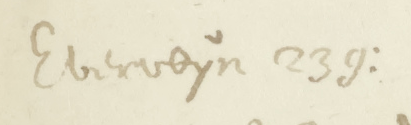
Everwijn 239:
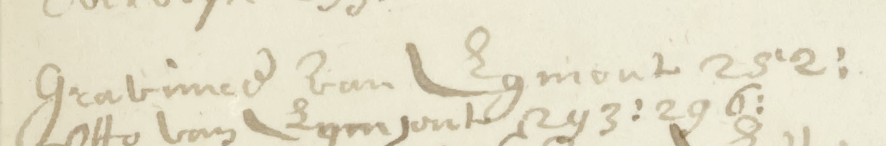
Gravinne van Egmont 252:
